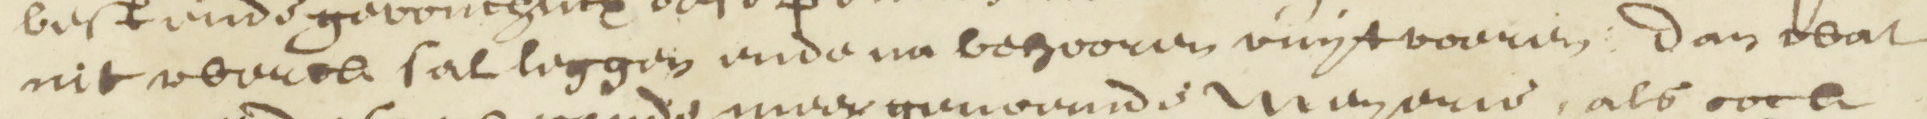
int werck sal leggen ende na behooren vuytvoeren: dan wat
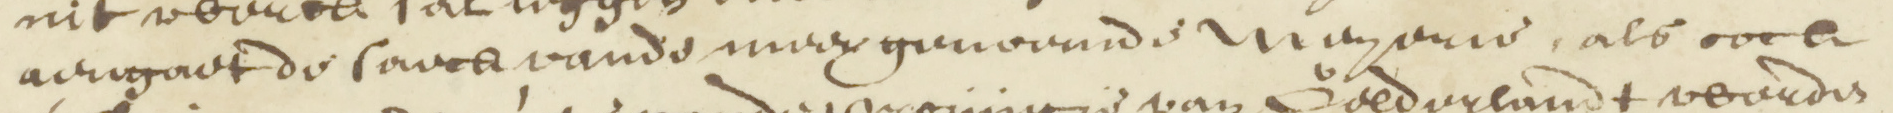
aengaet de saeck vande meer genoemde Meyerie, als oock
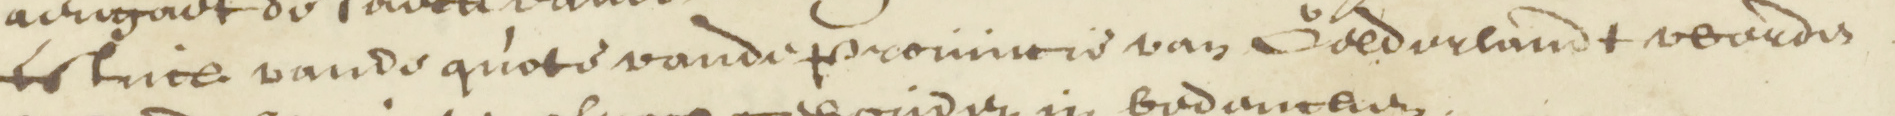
t'stuck vande quote vande prouincie van Gelderlandt werden
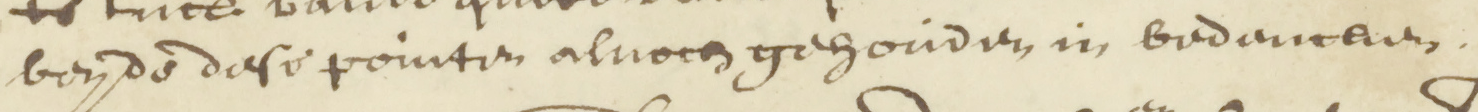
beyde dese pointen alnoch gehouden in bedencken:
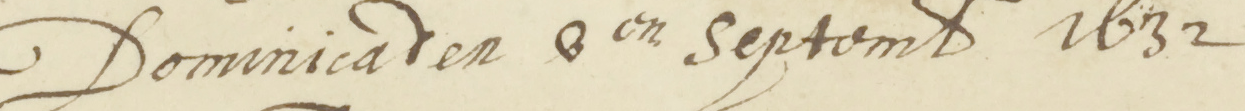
Dominica den ven Septemb 1632
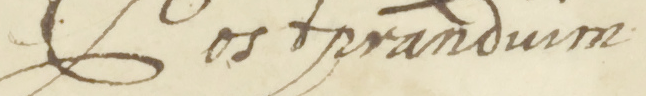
Post prandium
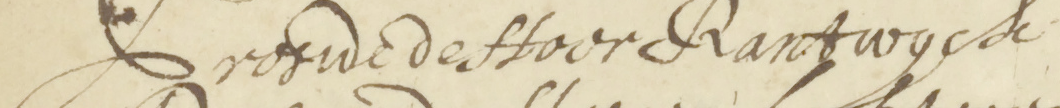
Preside de Heer Rantwyck
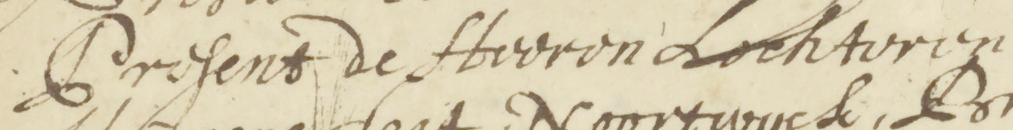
Present de Heeren Lochteren
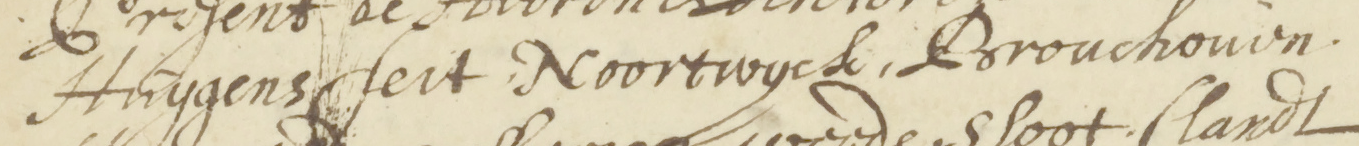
Huygens, Feit, Noortwyck, Brouchouen,
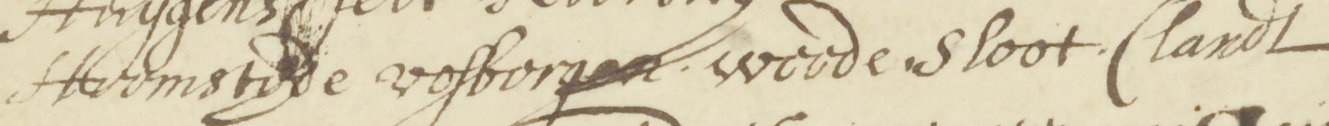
Heemstede Vosbergen, weede, Sloot, Clandt
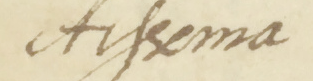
Aissema
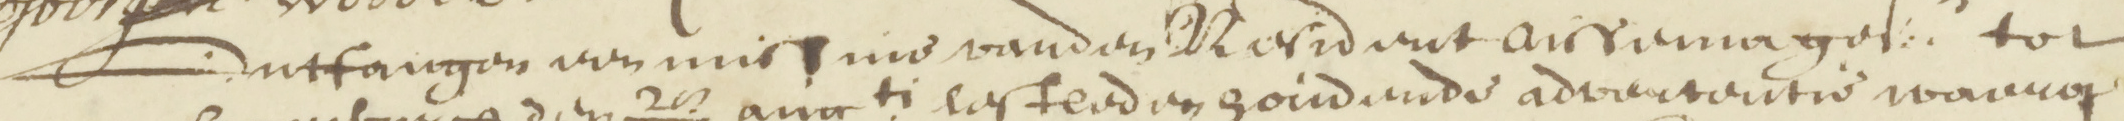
Ontfangen een missiue vanden Resident Aissema gesn. tot
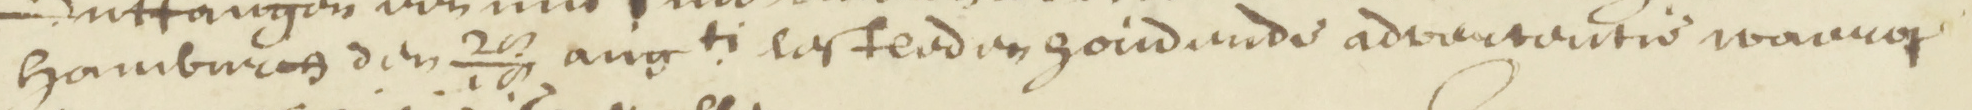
Hamburch den 28/18 augti. lestleden houdende advertentie waerop
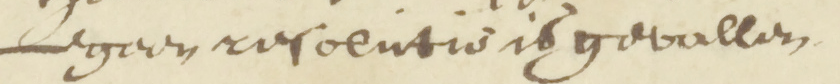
egeen resolutie is gevallen.
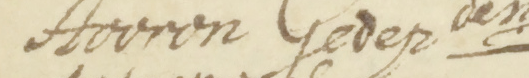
Heeren Gedepden.
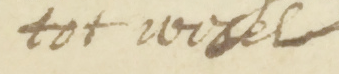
tot wesel
